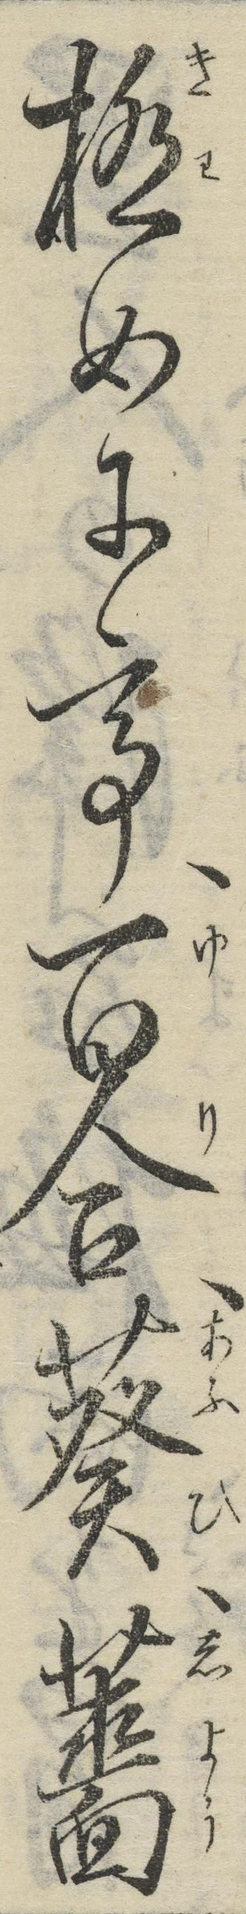極めにて、百合、葵、薔
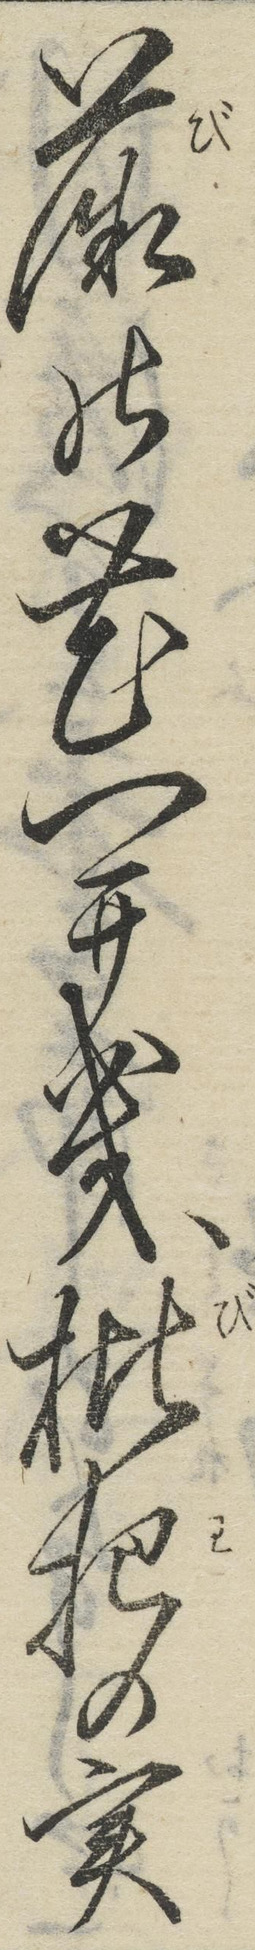薇の花開き、枇杷の実
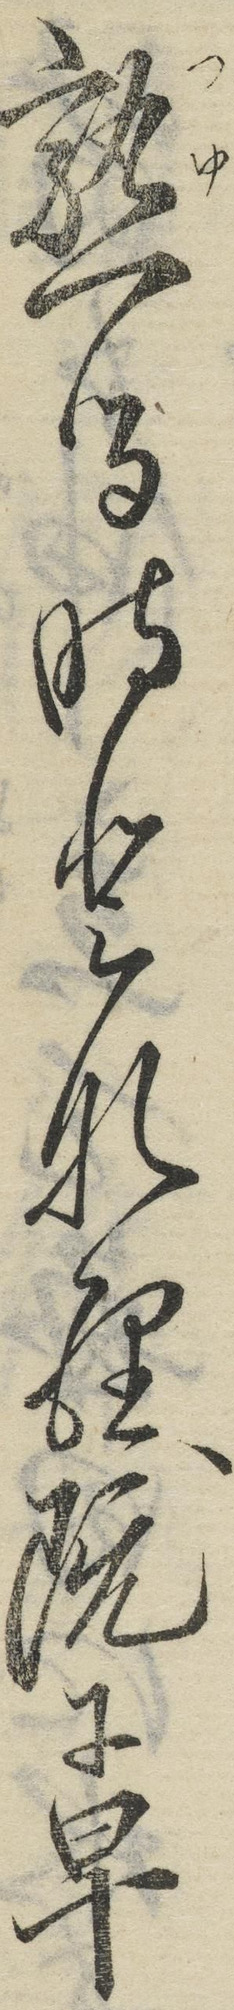熟る時となり、既に早

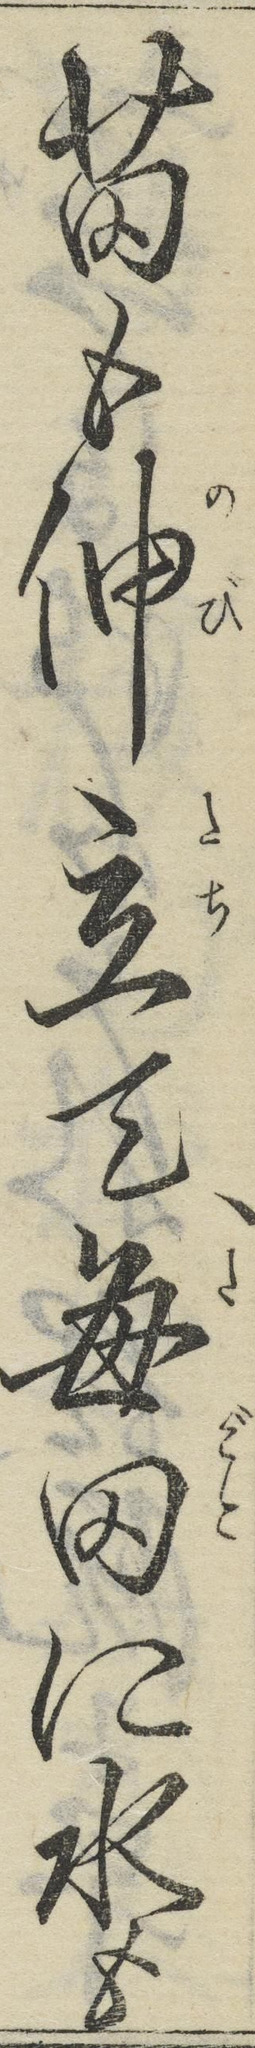苗も伸立て、毎田に水も
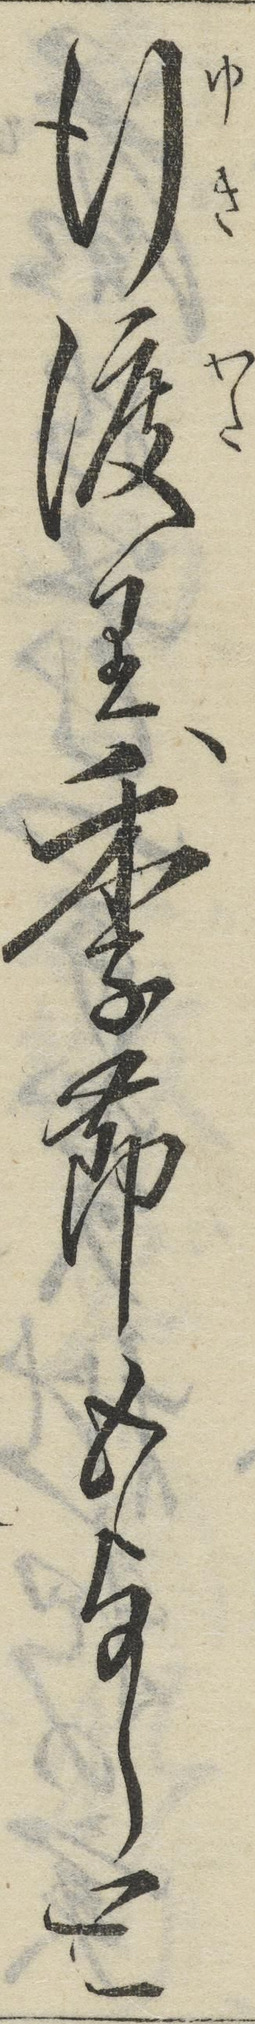行渡り、季節もよしと
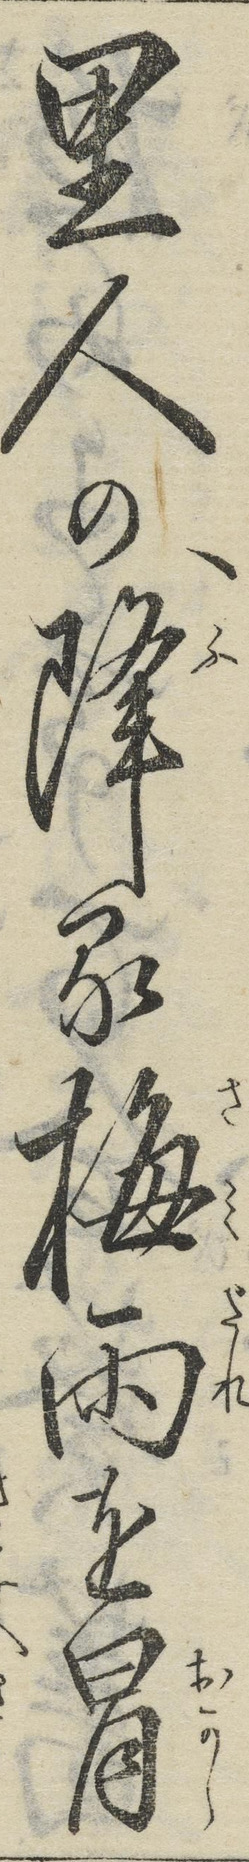里人の、降る梅雨を冒
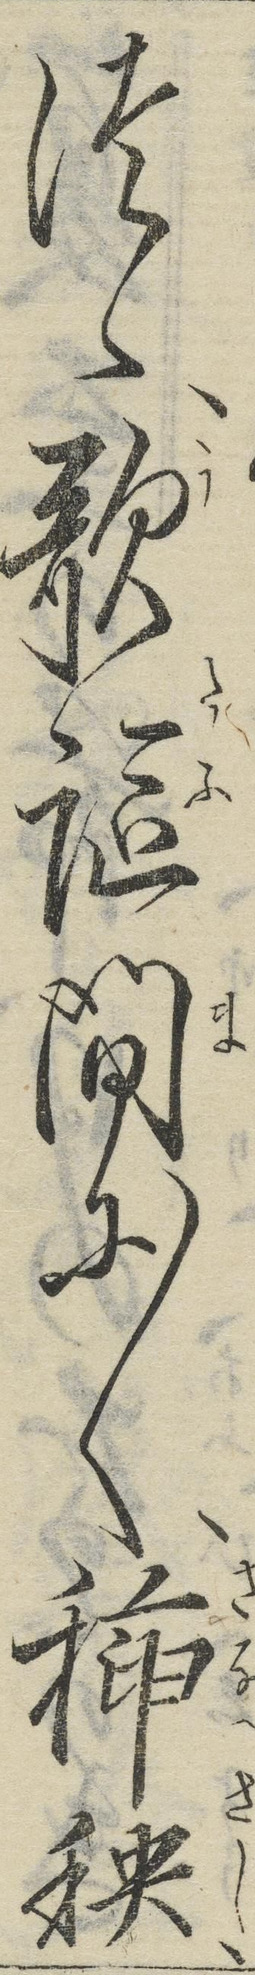つゝ、歌謳間に〳〵、挿秧、
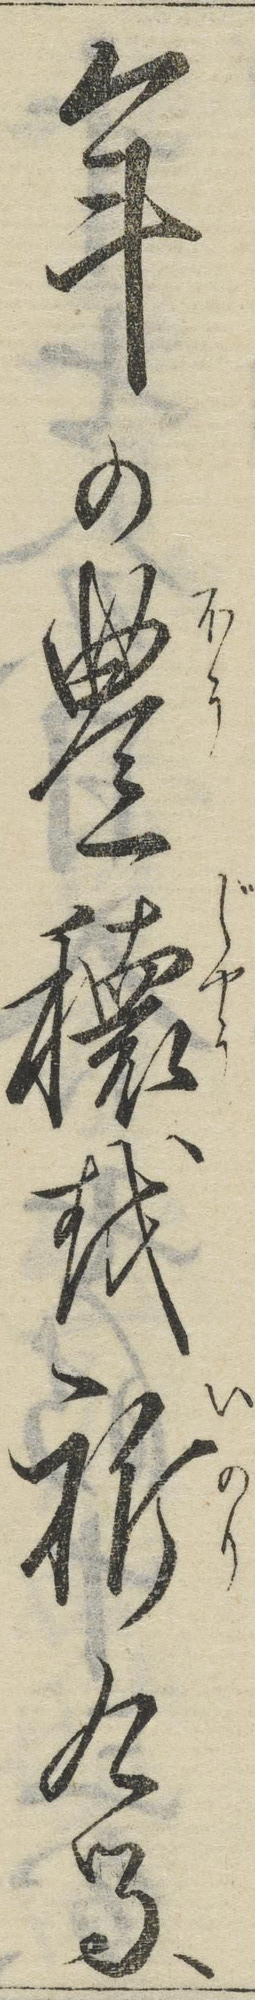年の豊穣を祈ける、
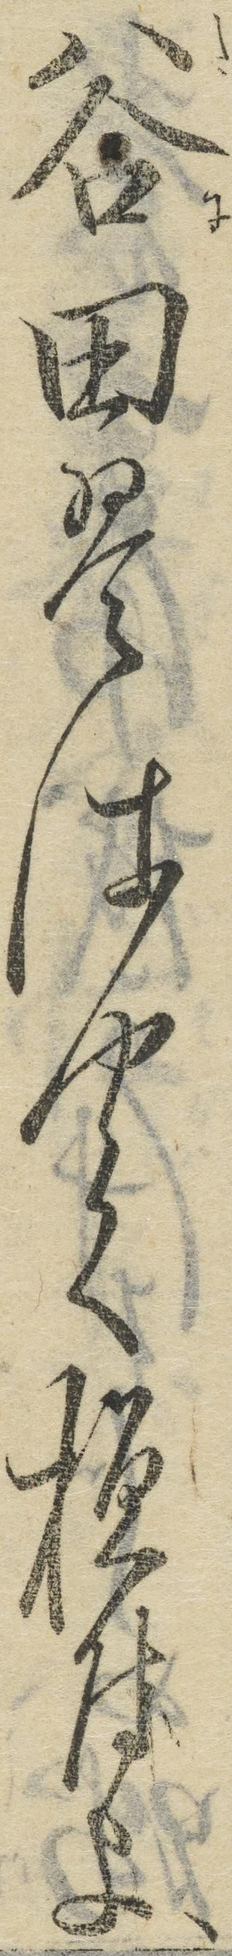谷田ははやく植付よ、
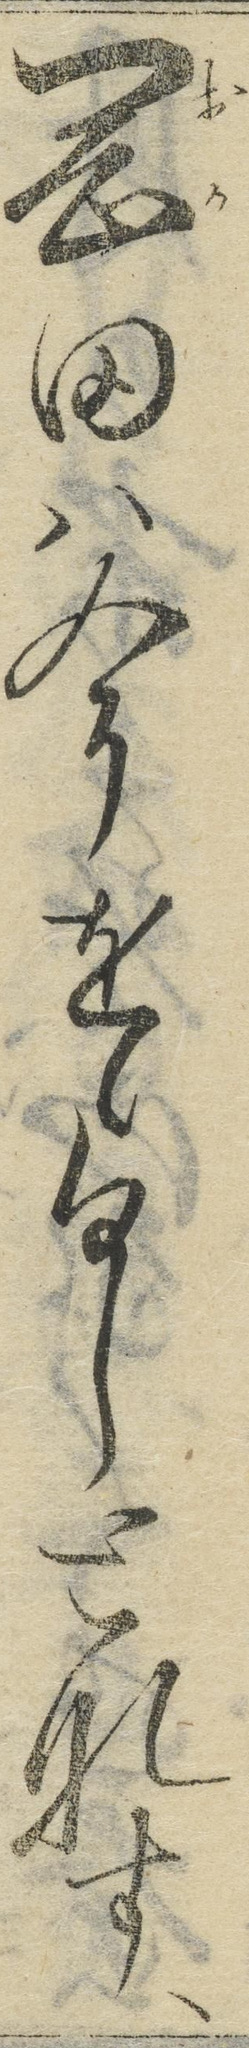岡田は今をよしとなす、
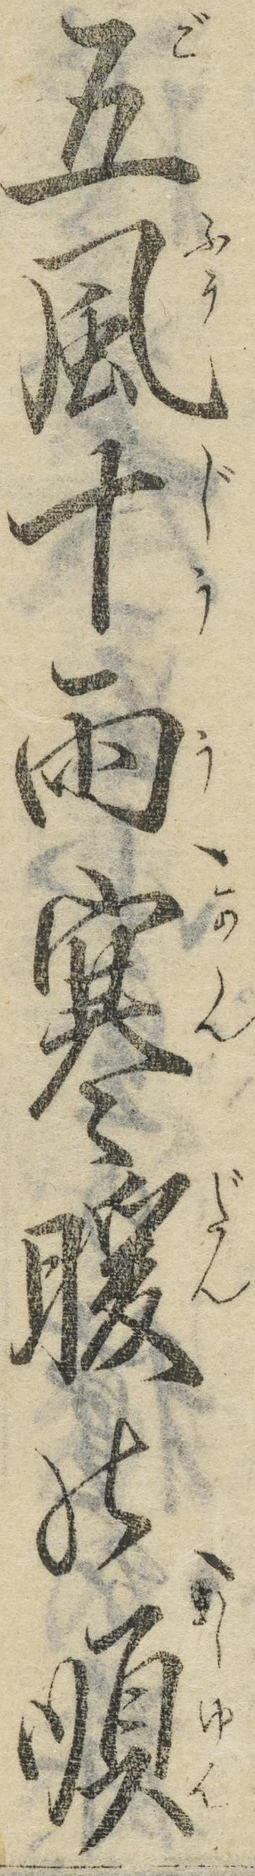五風十雨、寒暖の、順
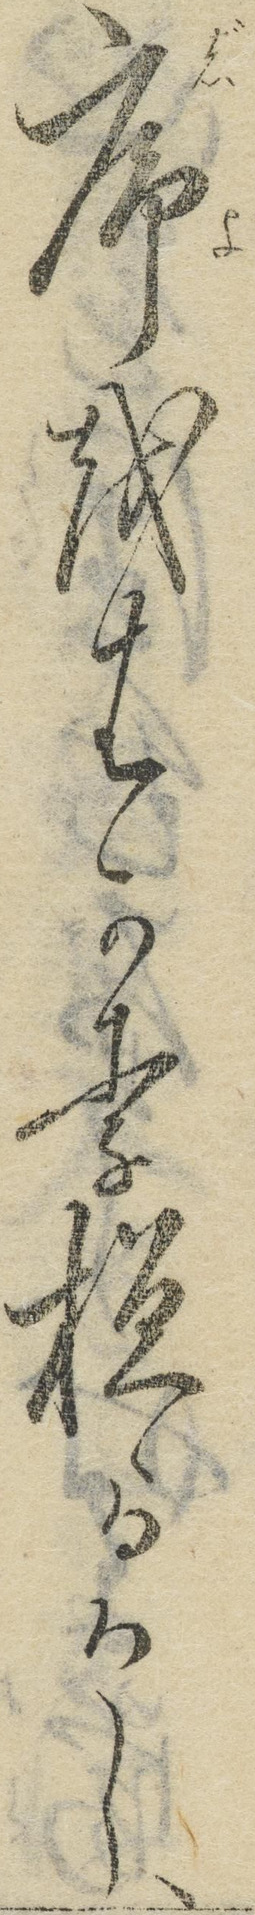序をはかり植よろし、
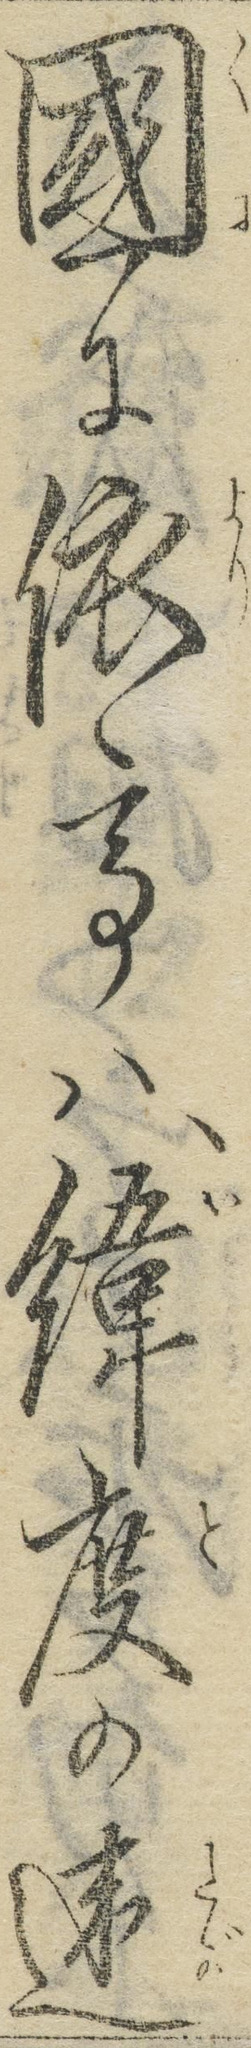国に依ては、緯度の違

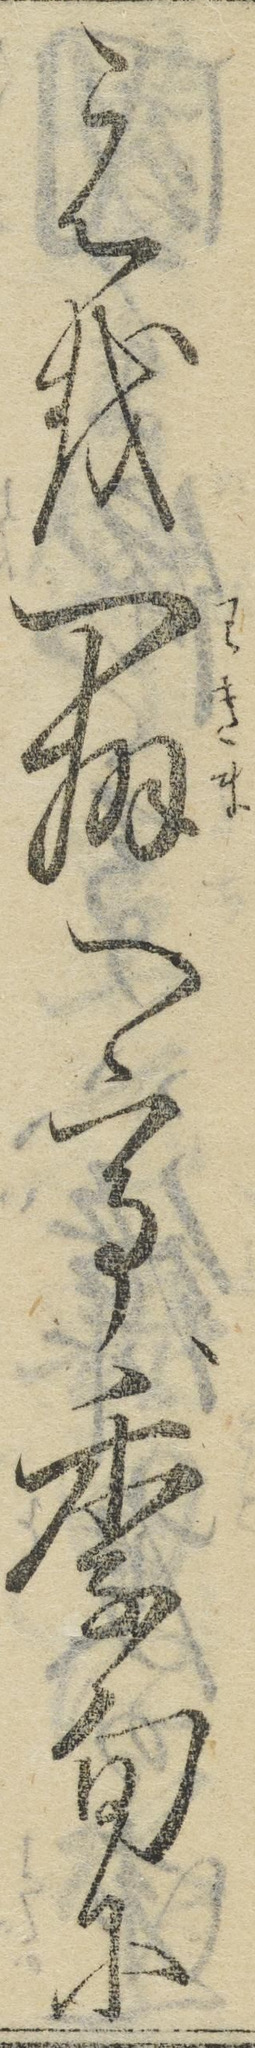えを辨へて、季旬に
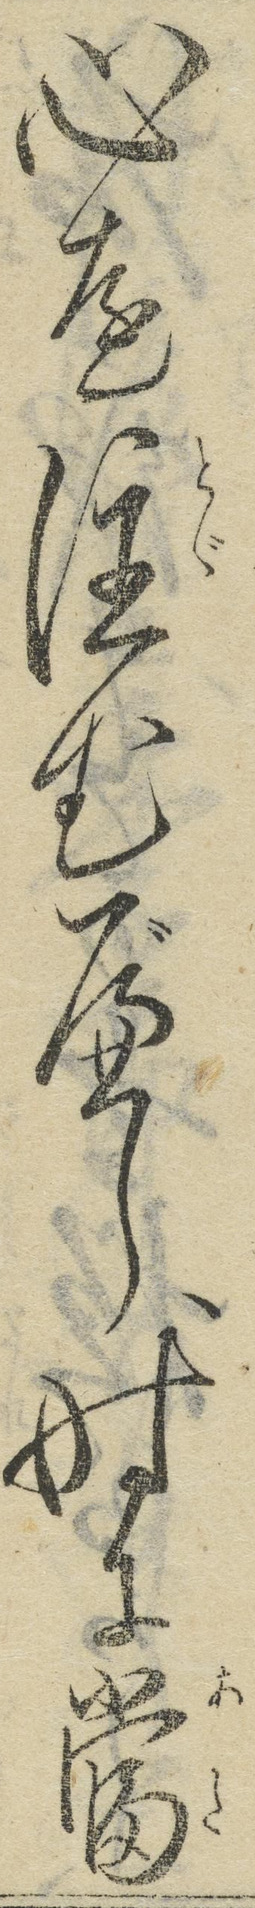心を住むべし、時に当
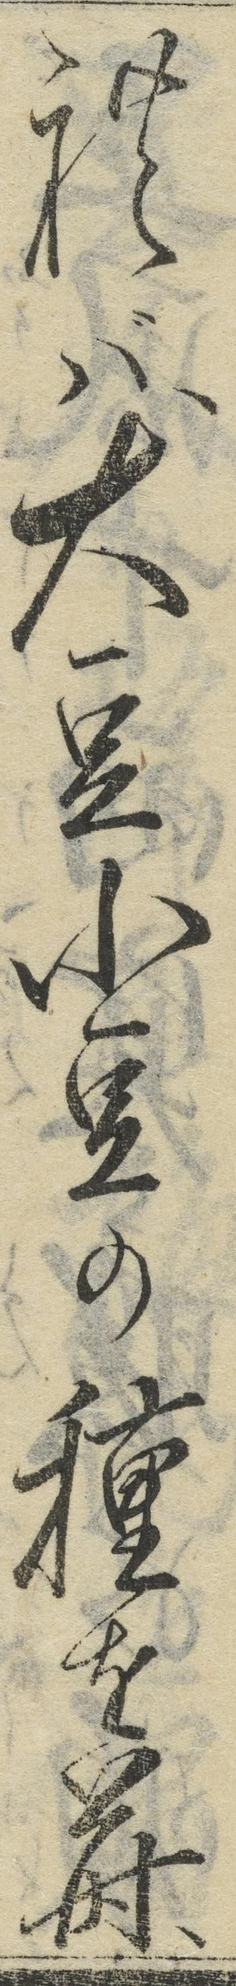れば、大豆小豆の種を蒔、
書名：暦日往来　單
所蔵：東京大学地震研究所図書室 Earthquake Research Institute Library, The University of Tokyo, JAPAN
